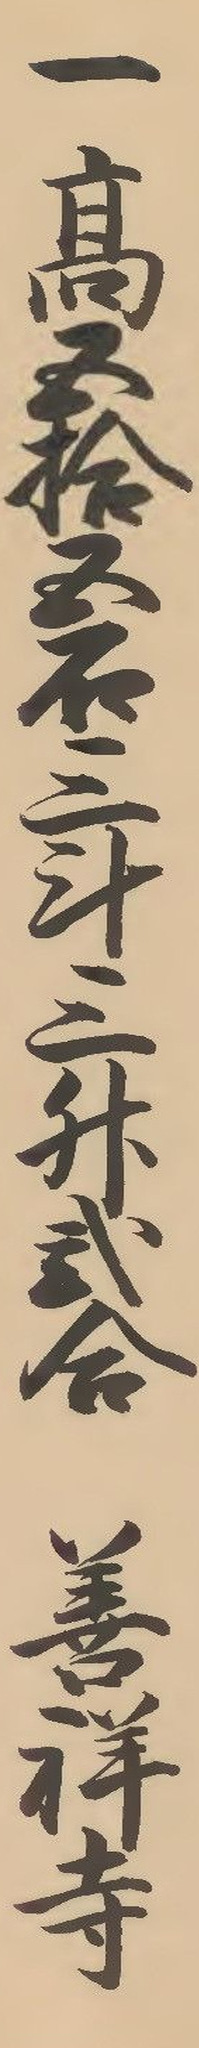一髙五拾五石三斗三升弐合善祥寺
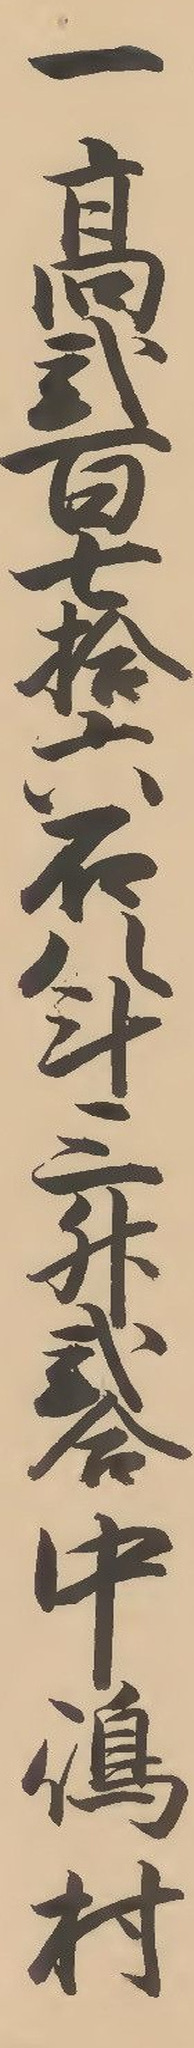一髙弐百七拾六石八斗三升弐合中嶋村
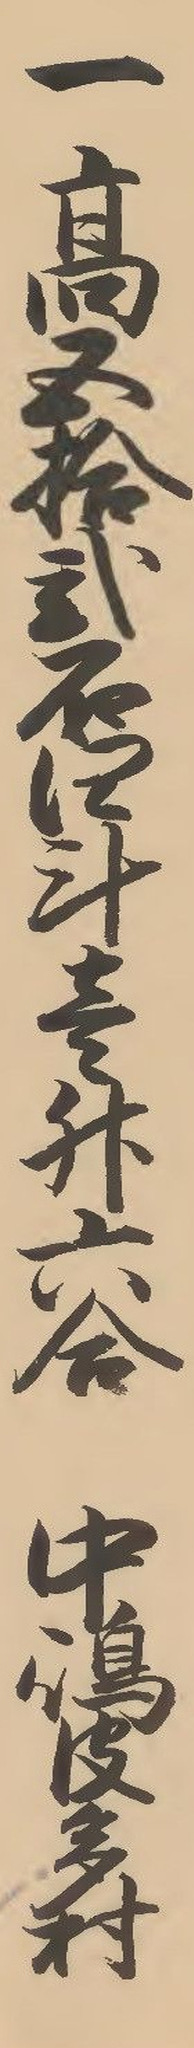一髙五拾弐石四斗壱升六合中嶋皮多村

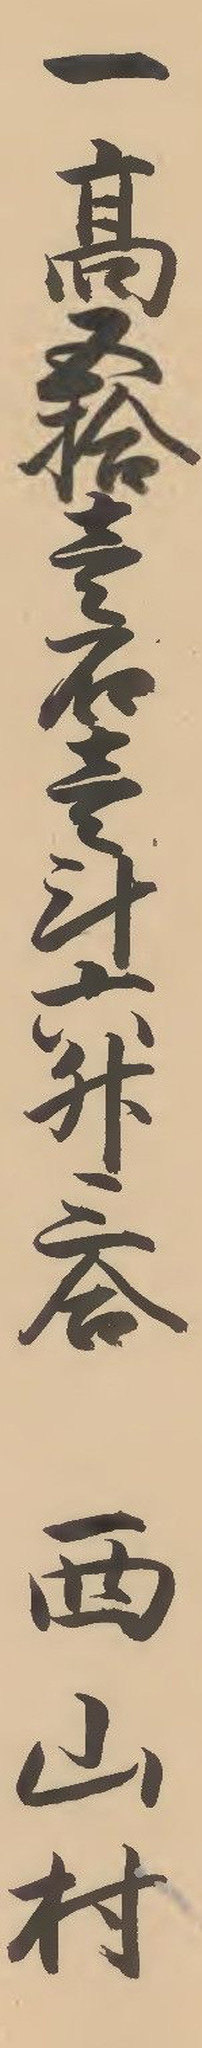一髙五拾壱石壱斗六升三合西山村
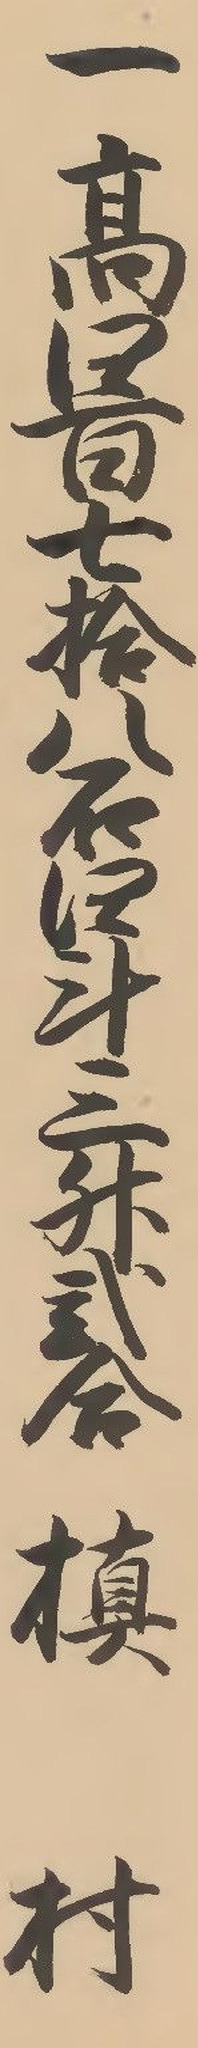一髙四百七拾八石四斗三升弐合槙村
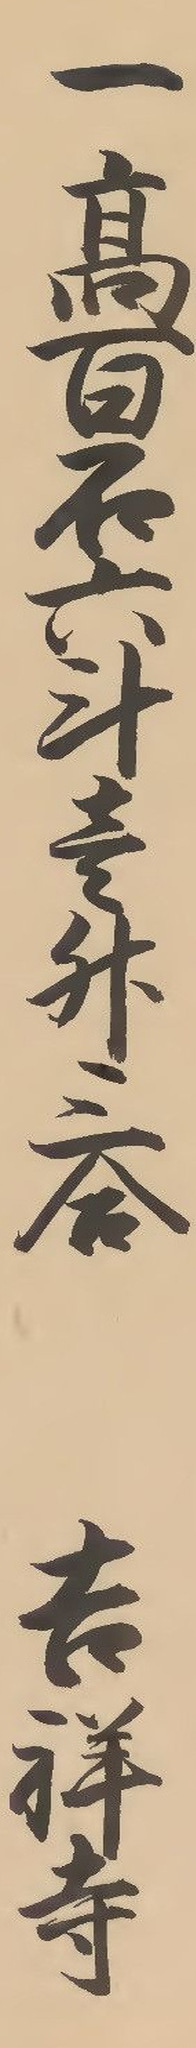一髙百石六斗壱升三合吉祥寺
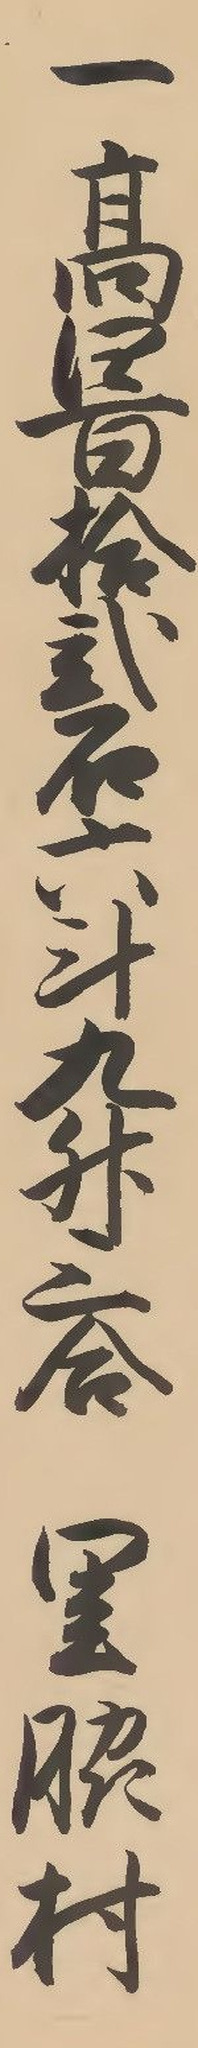一髙四百拾弐石六斗九升三合里脇村
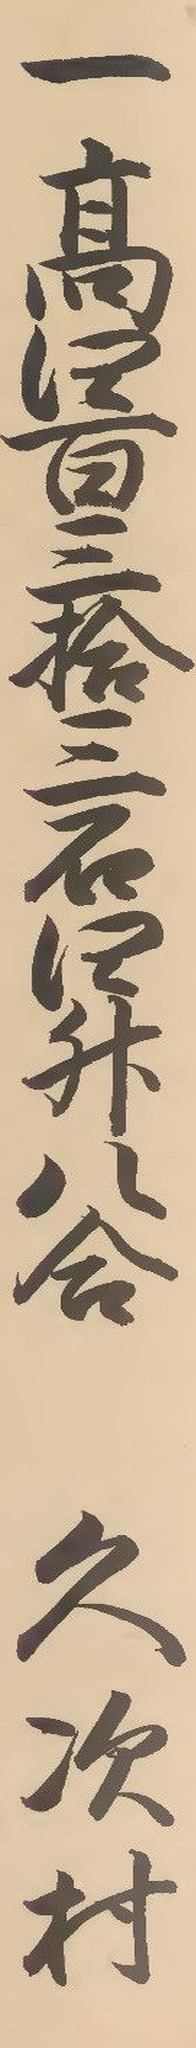一髙四百三拾三石四升八合久次村
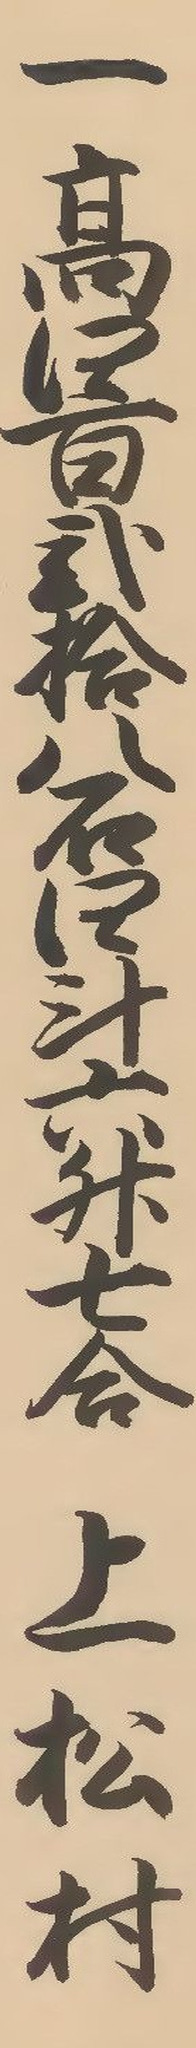一髙四百弐拾八石四斗六升七合上松村
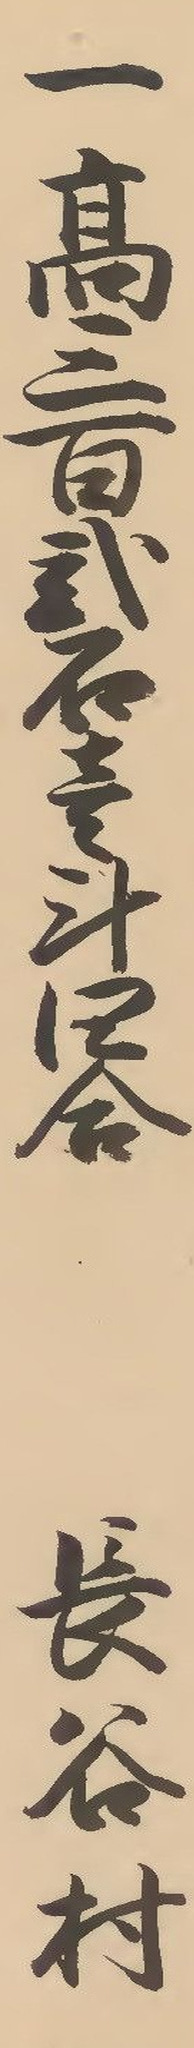一髙三百弐石壱斗四合長谷村
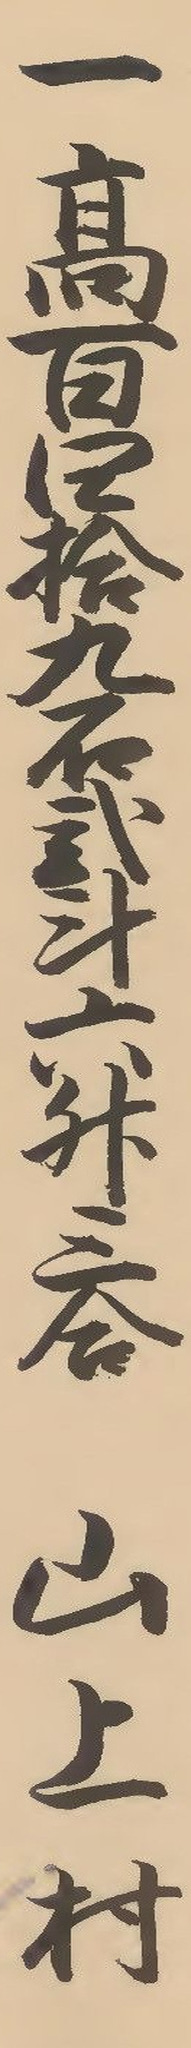一髙百四拾九石弐斗六升三合山上村

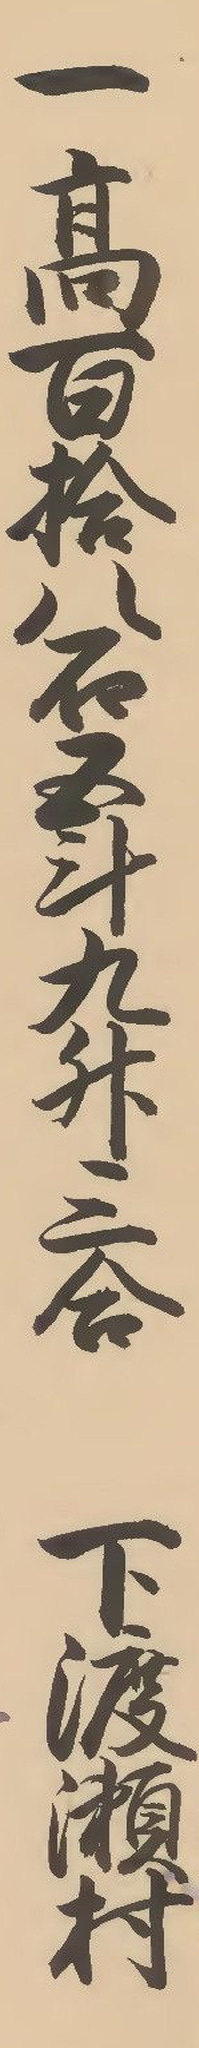一髙百拾八石五斗九升三合下渡瀬村
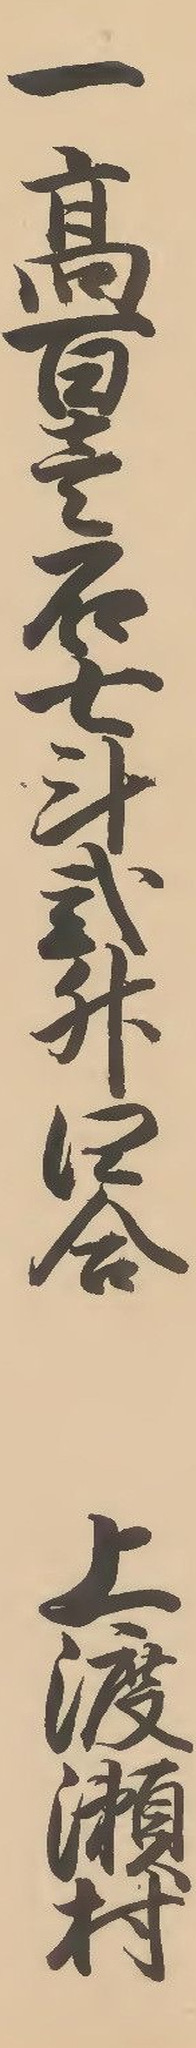一髙百壱石七斗弐升四合上渡瀬村
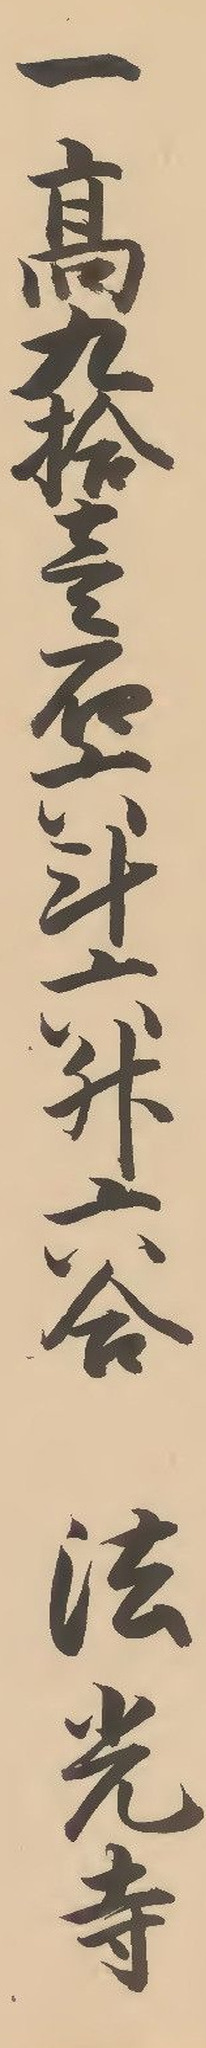一髙九拾壱石六斗六升六合法光寺
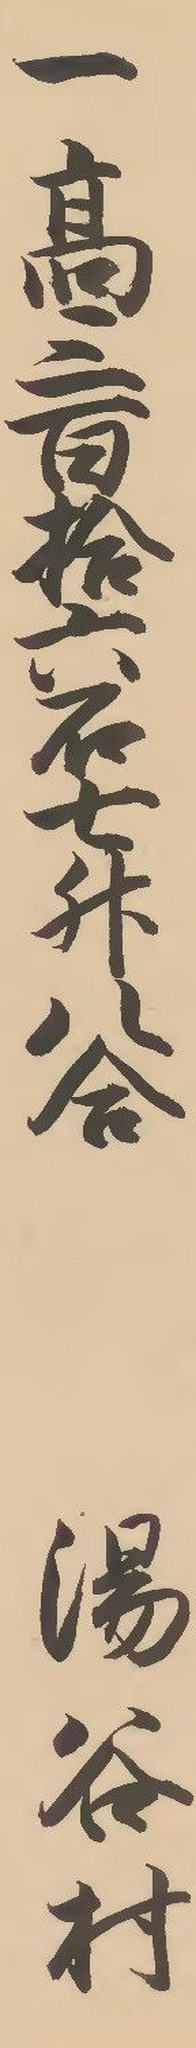一髙三百拾六石七升八合湯谷村
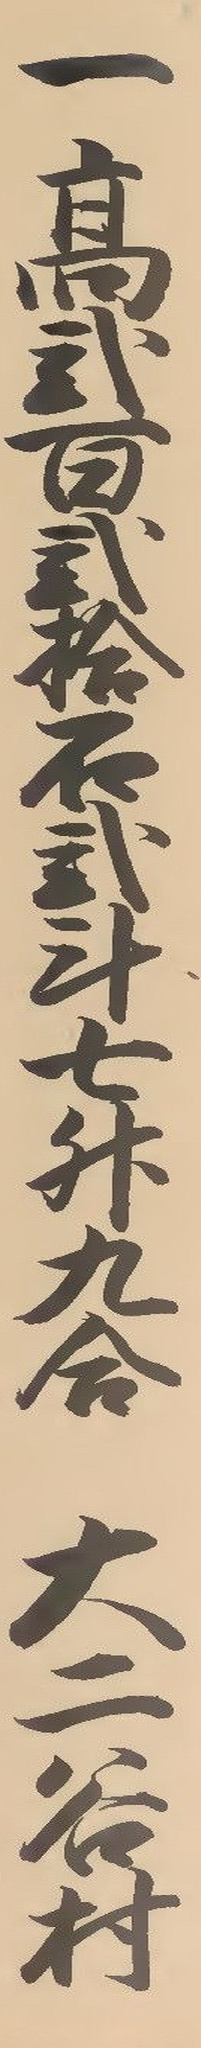一髙弐百弐拾石弐斗七升九合大二谷村
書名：播磨国郷帳
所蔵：国立公文書館 National Archives of Japan
